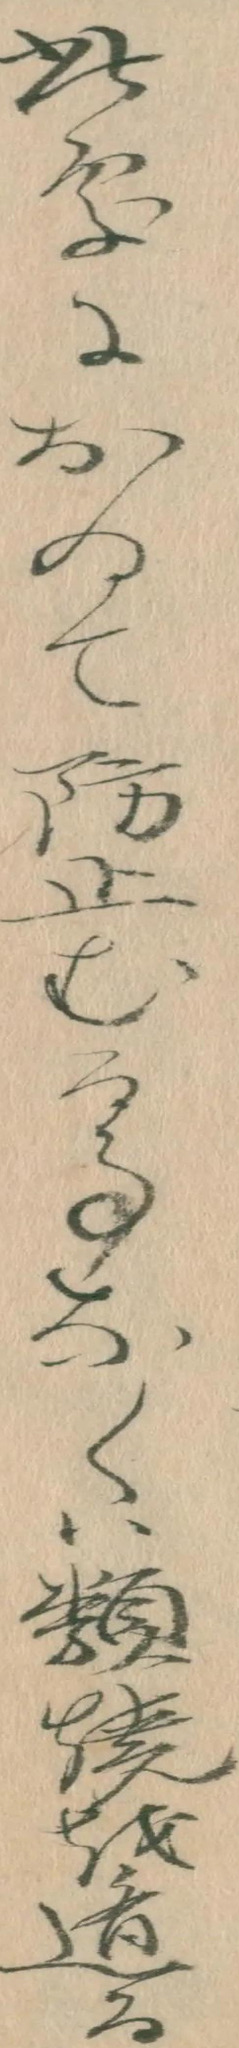此処におゐて防止むる事なくは類焼を遁る
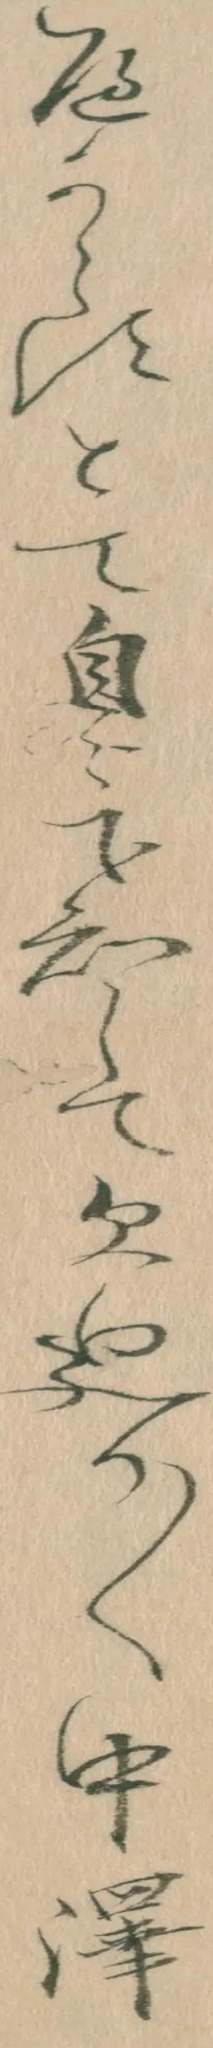へからすとて自ら下知して欠廻り〳〵中澤
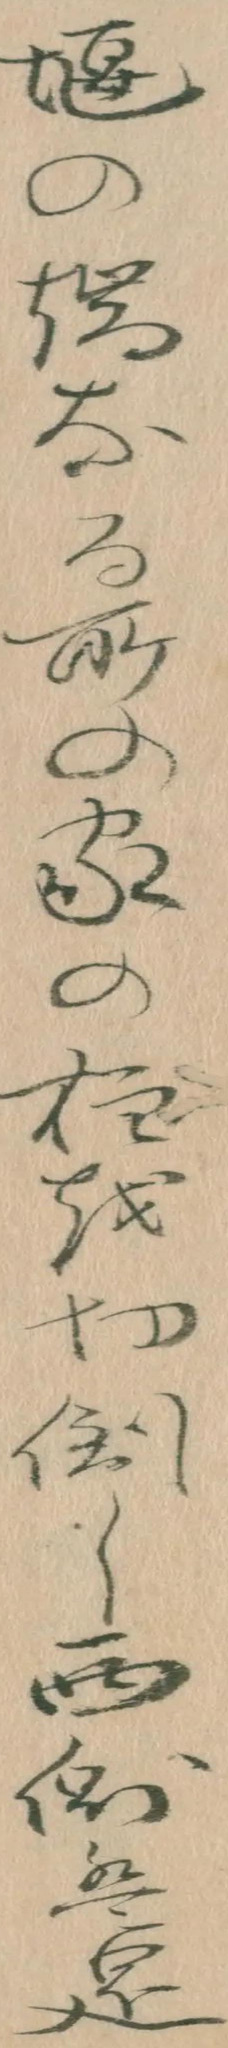堰の端なる所の家の柱を切倒し西側は是
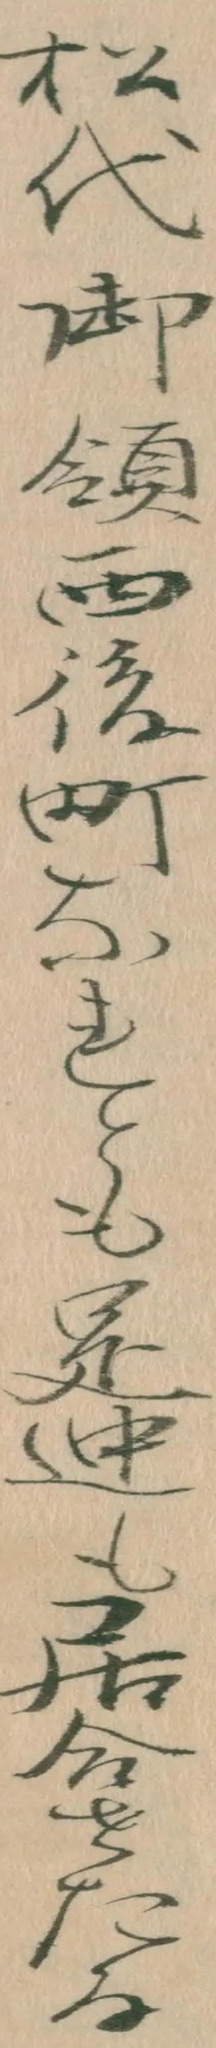松代御領西後町なれとも是迚も居合せたる
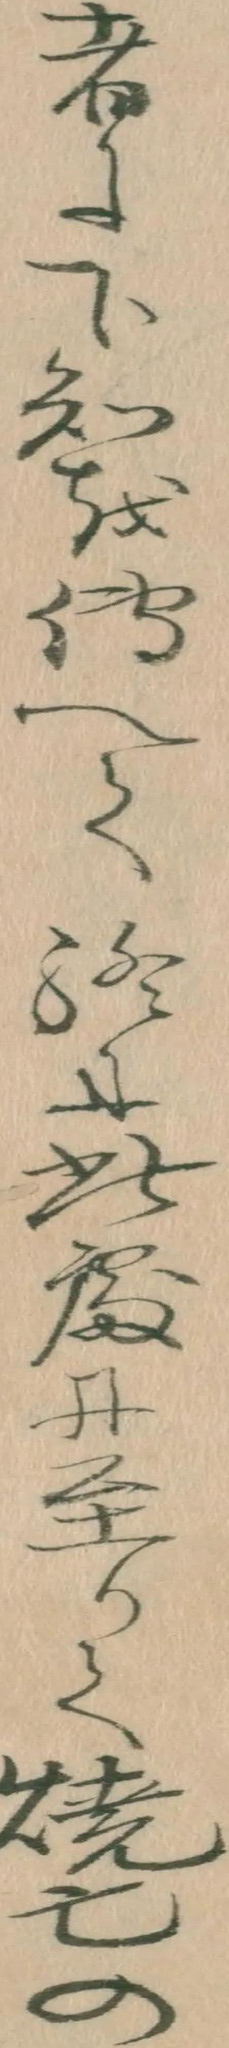者に下知を伝へて終に此処に至りて焼亡の
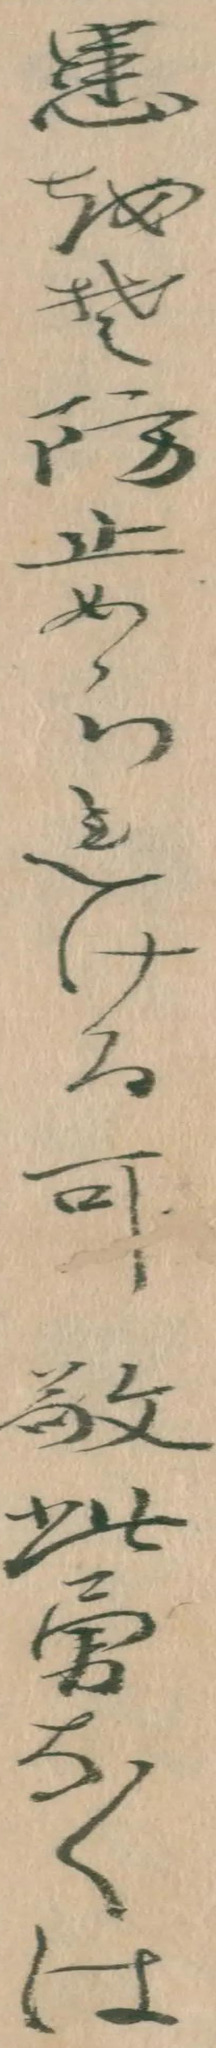患をそ防止められける可敬此勇なくは
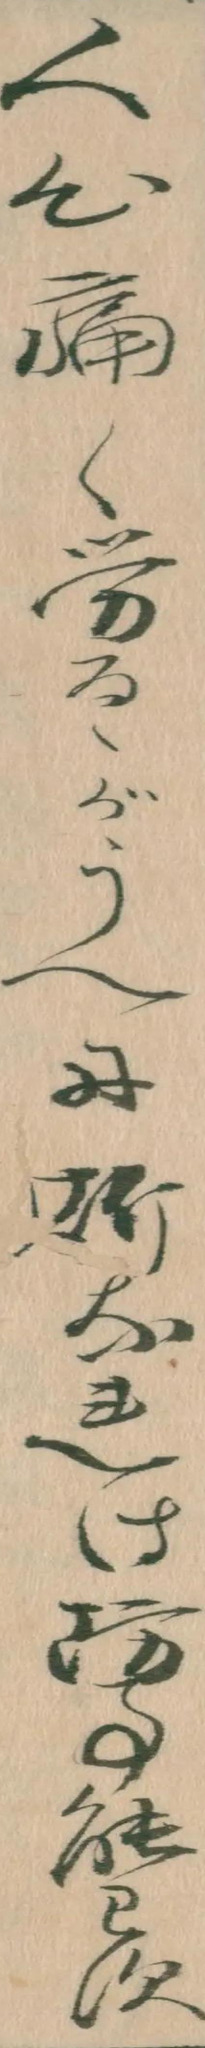人心痛く労るゝがうへに斯なれは防事能わす
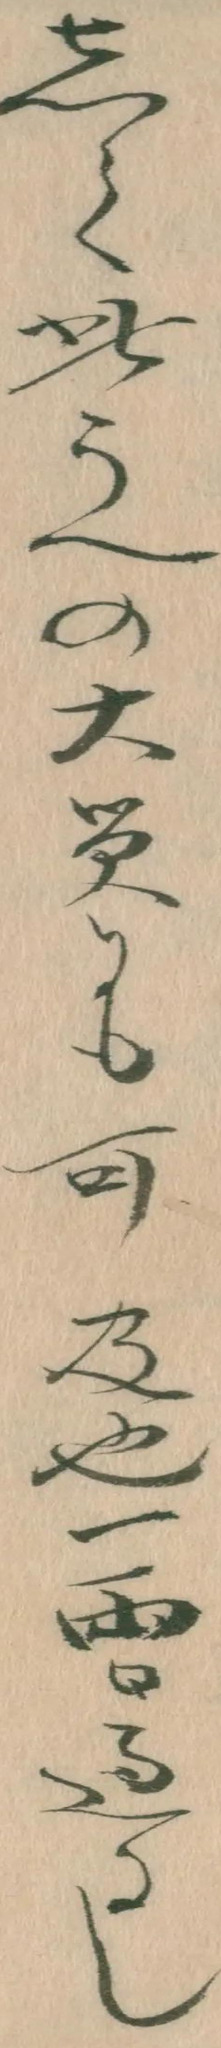して此うへの大災にも可及也一両日過にし
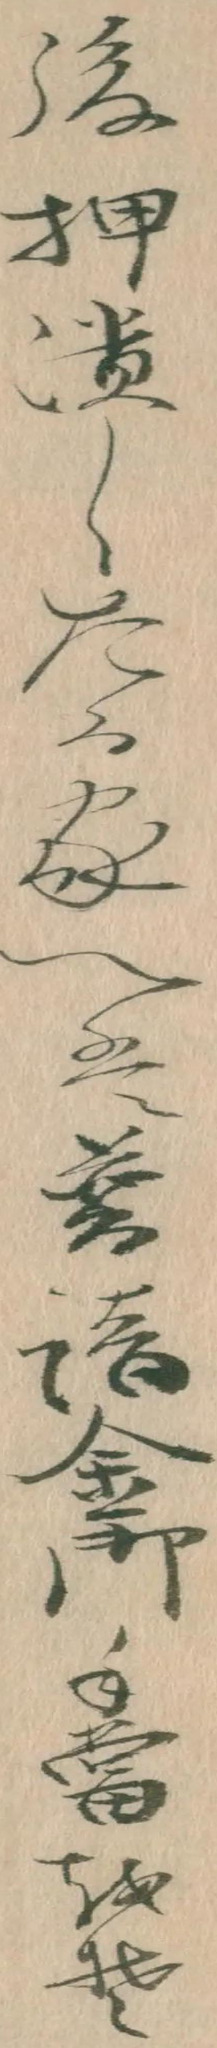後押潰したる家へは普請金御手当をそ
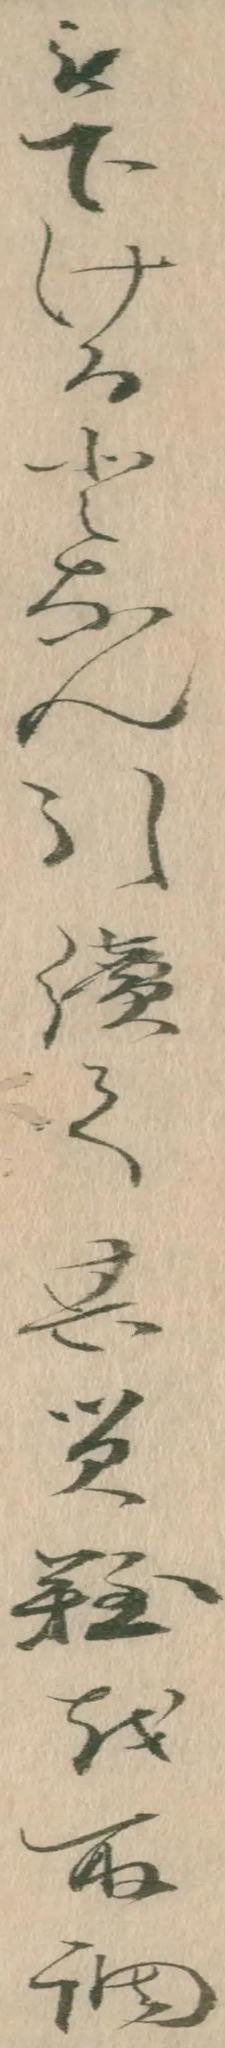被下けるとなん引続て其災難を取調
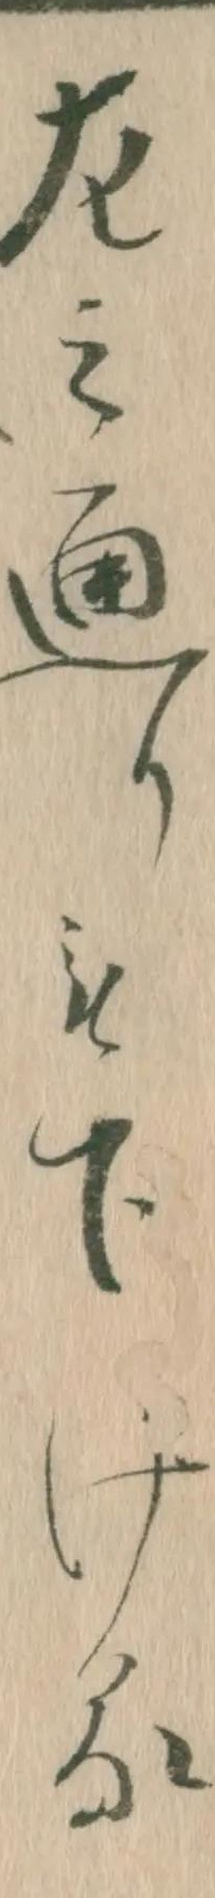左之通り被下ける
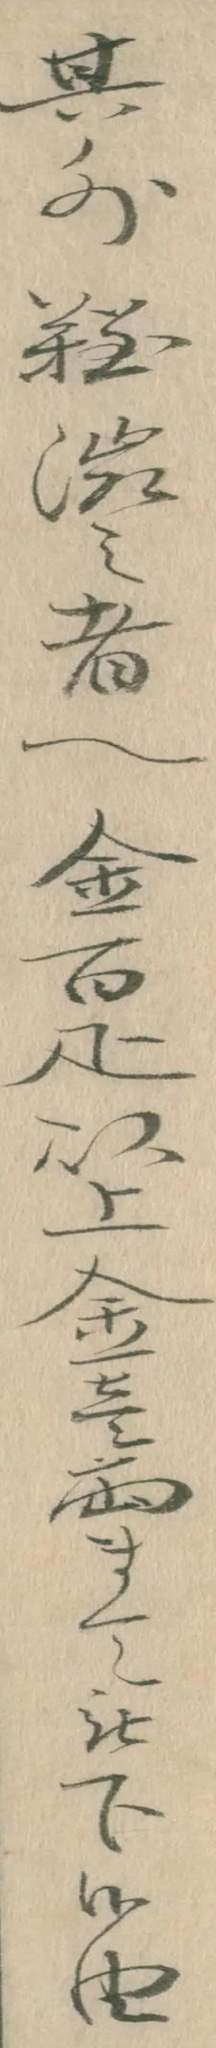其外難渋之者へ金百疋以上金壱両まて被下候由

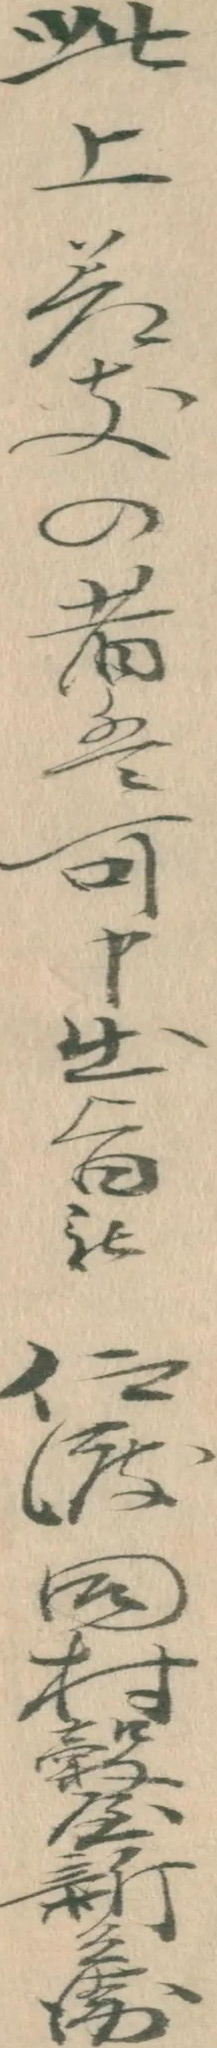此上差支の者は可申出旨被仰渡同村穀屋新兵衛
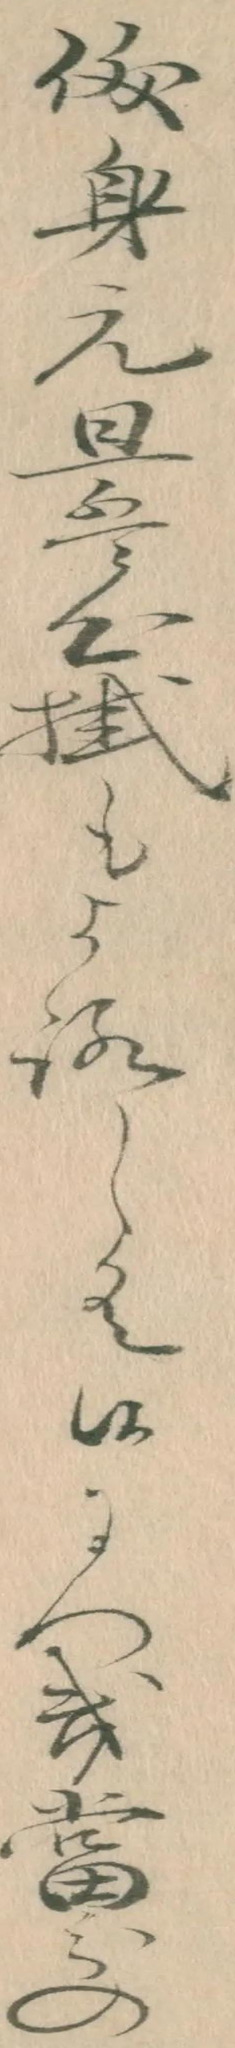儀身元且は心掛もよろしく候につき当分の
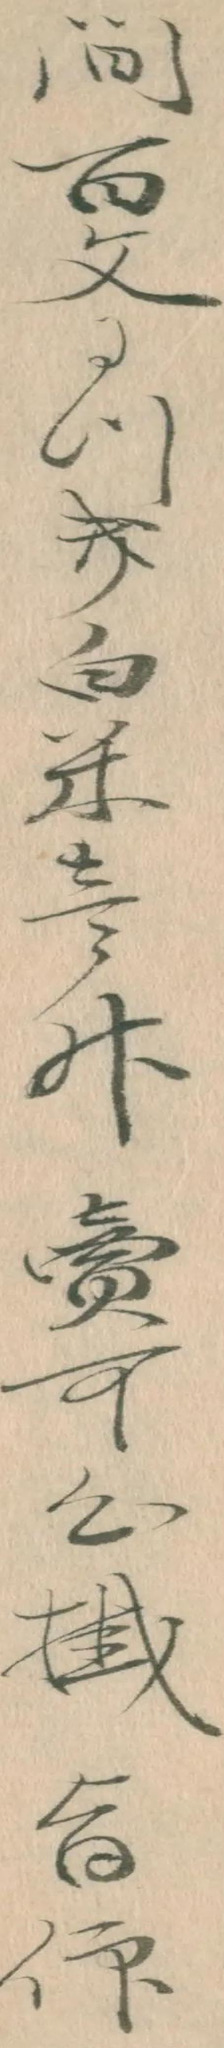間百文につき白米壱升売可心掛旨仰
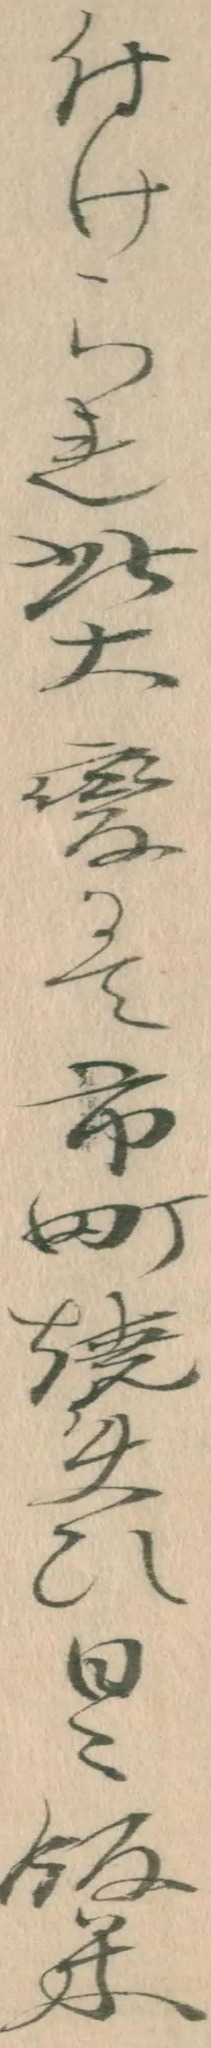付けられ此大変にて市町焼失ひ日〻飯米
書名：俗語之種. [6]
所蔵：国立国会図書館 National Diet Library, JAPAN
